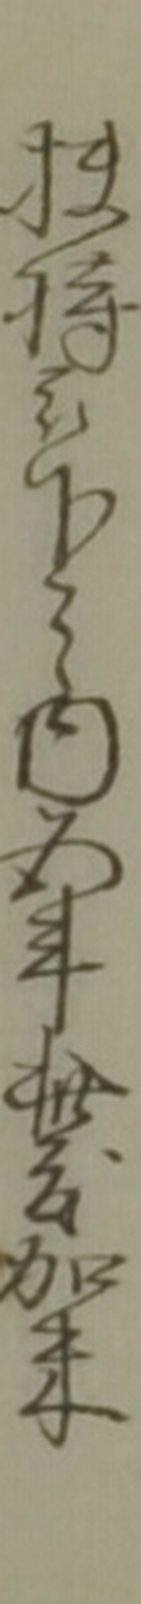扶持被下之内五斗此度加米
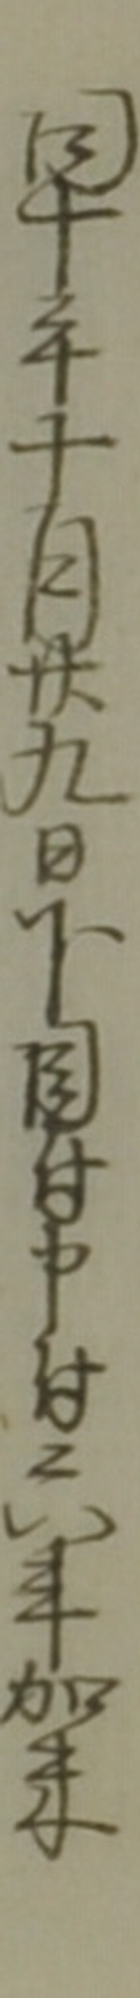一同十午十月廿九日下目付申付六斗加米
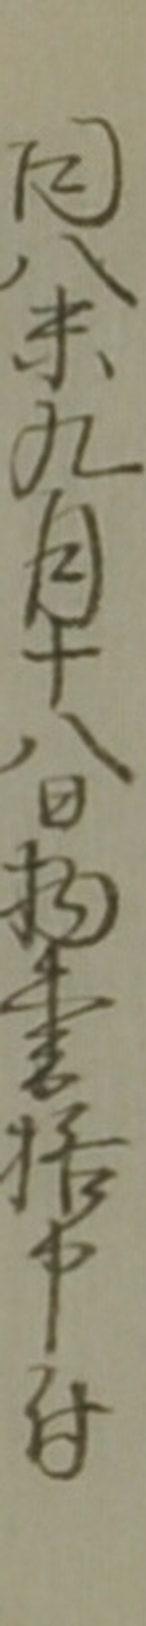一同八未九月十八日物書格申付
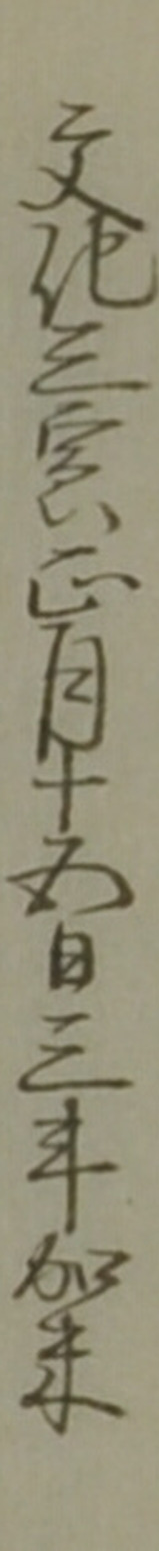一文化三寅正月十五日三斗加米
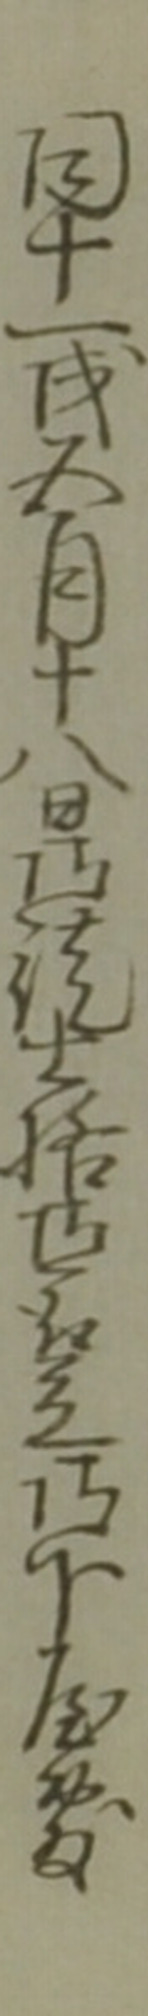一同十一戌五月十八日御徒士格御取立御下屋敷
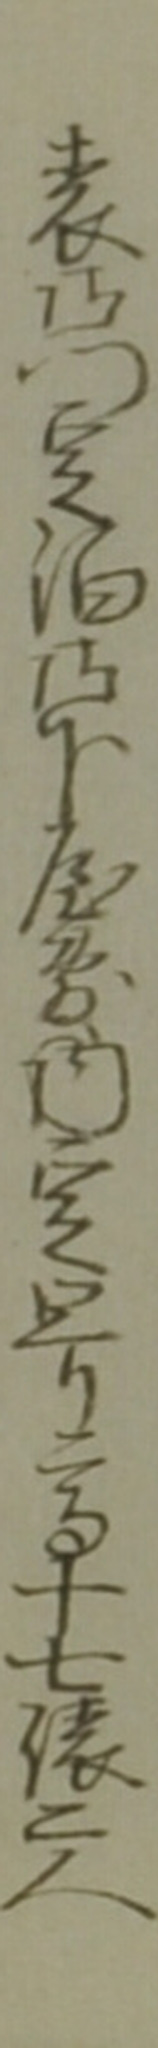表御門定泊御下屋敷内定廻り高十七俵二人
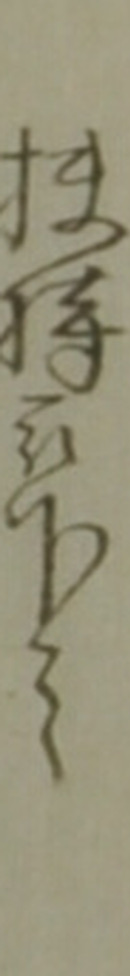扶持被下之
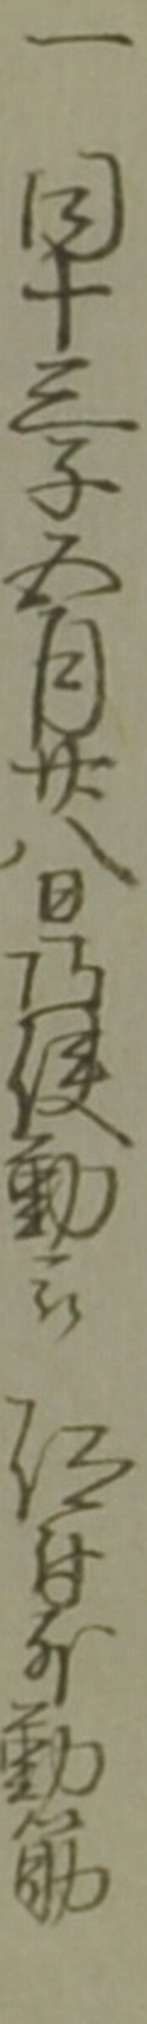一同十三子五月廿八日御使勤被仰付外勤筋
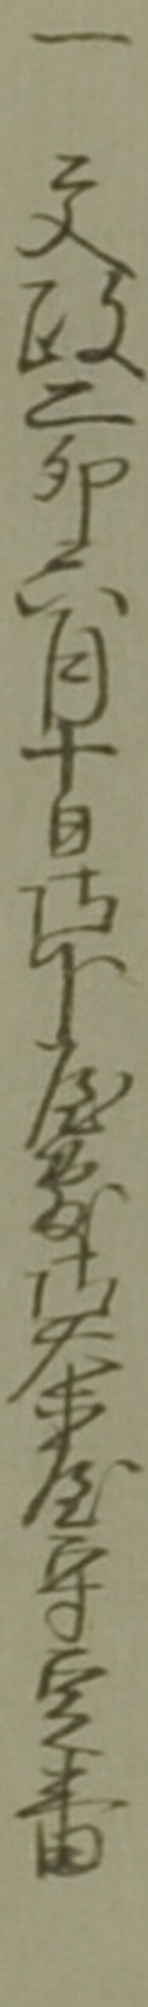一文政二卯六月十日御下屋敷御茶屋守定番
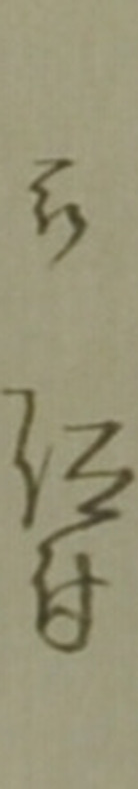被仰付
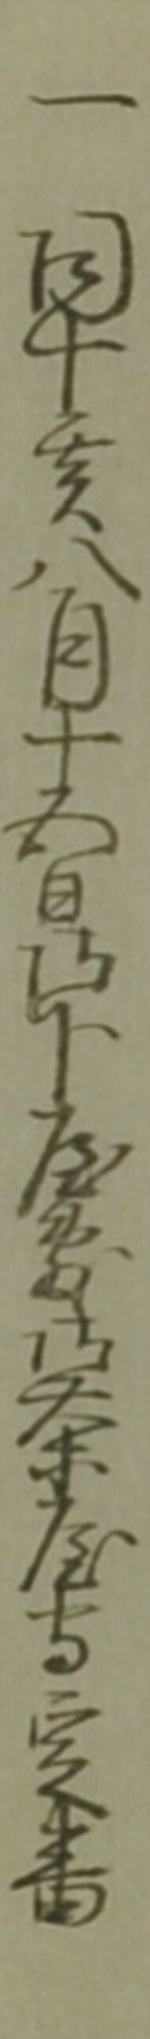一同十亥八月十五日御下屋敷御茶屋守定番
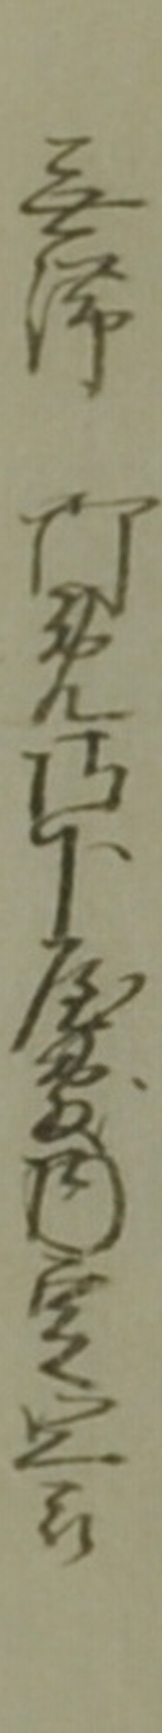無滞御免御下屋敷内定廻被
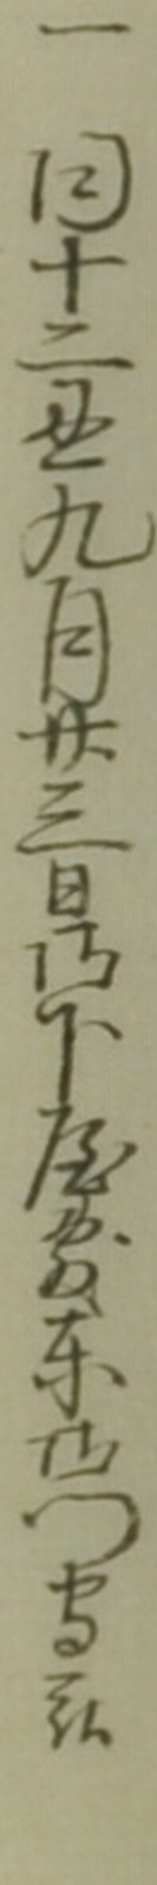一同十二丑九月廿三日御下屋敷東御門守被
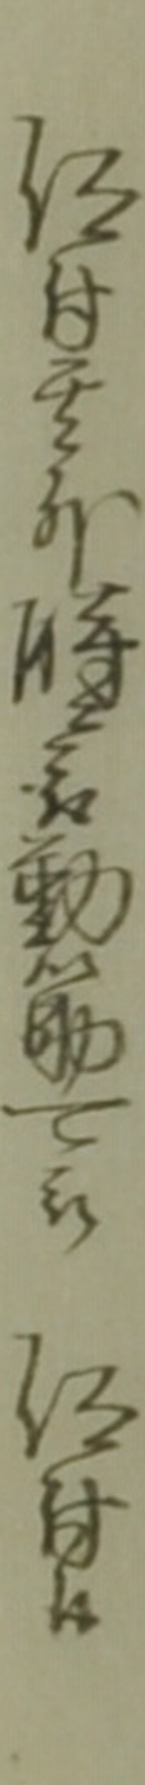仰付其外時ニ取勤筋可被仰付候

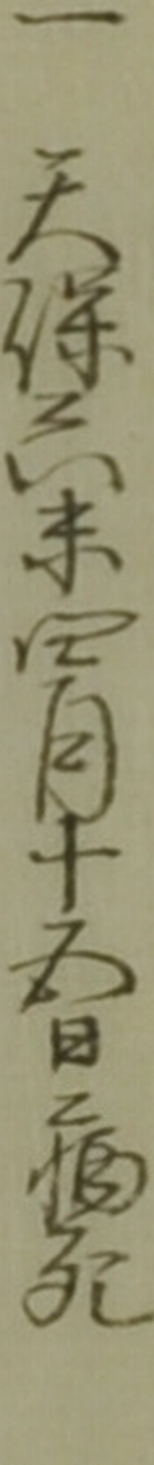一天保六未四月十五日病死
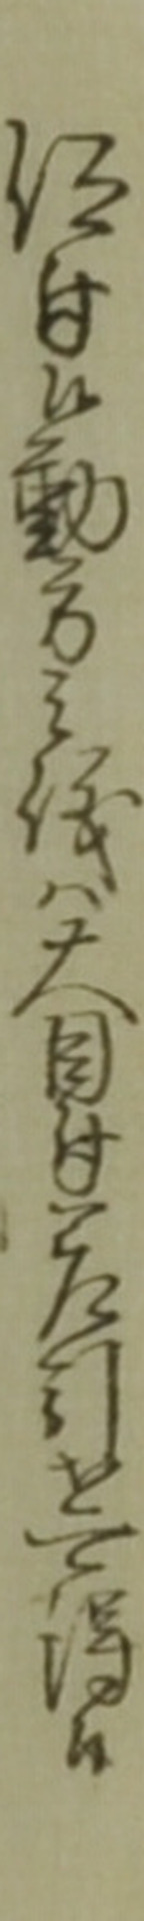仰付候勤方之儀ハ大目付差引を可得候
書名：無足諸士勤仕録（七）
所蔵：伊那市立高遠町図書館・合同会社AMANE
